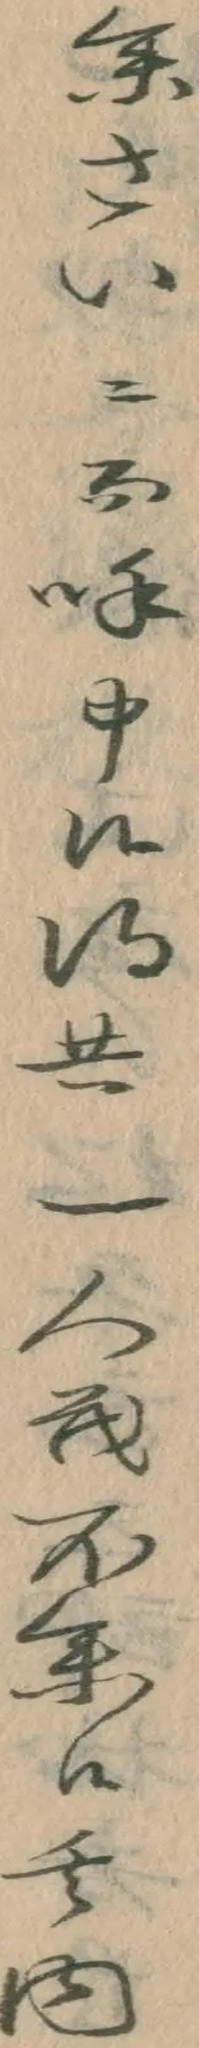参さいに而呼申候得共一人茂不参候其内
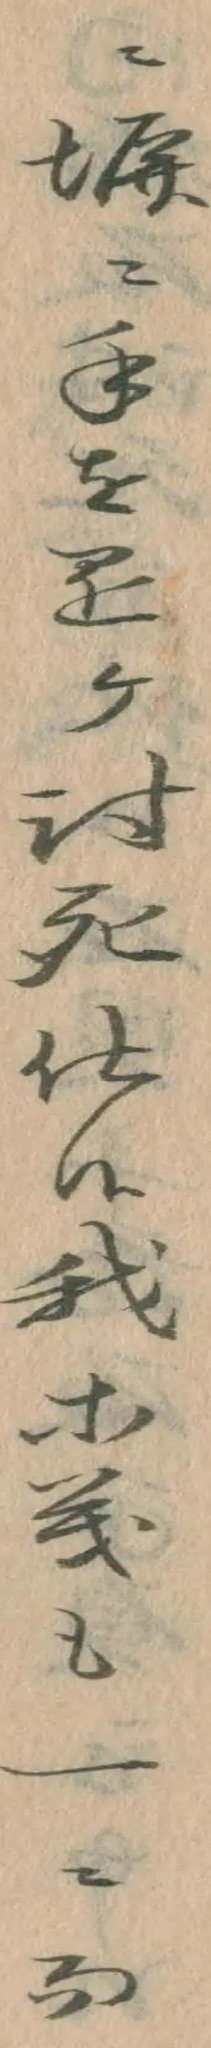に塀に手を懸け討死仕候我ら義も一に而
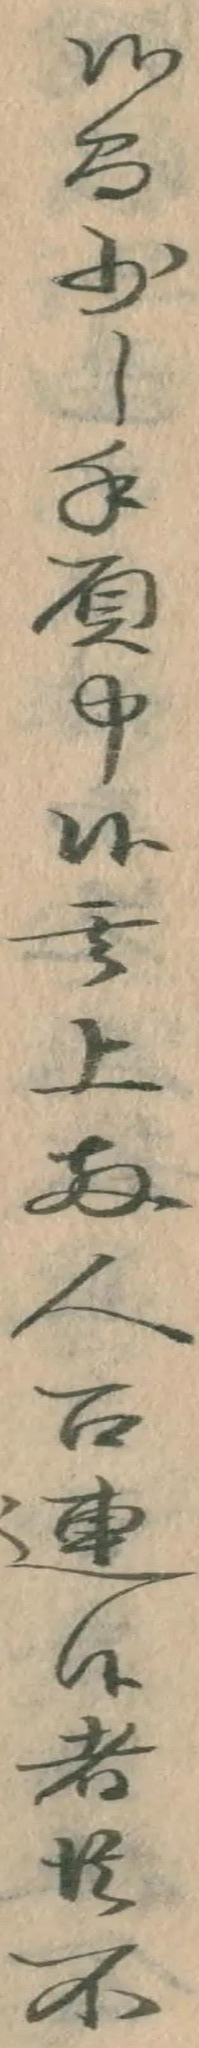候間少し手負申候其上両人召連候者共不
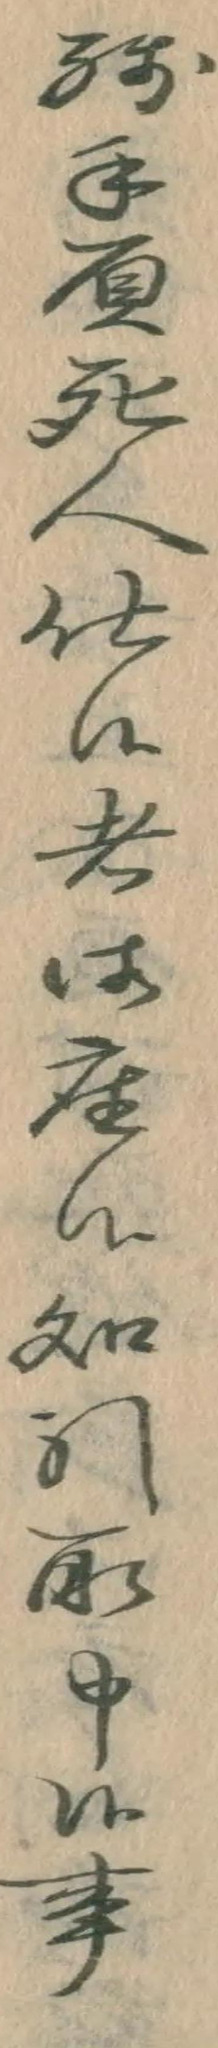残手負死人仕候者御座候処引取申候事
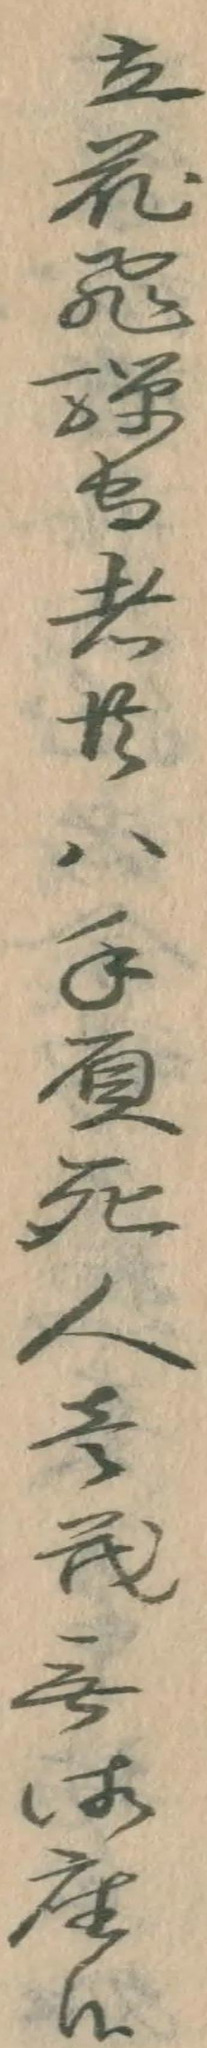一立花飛騨守者共は手負死人壱茂無御座候
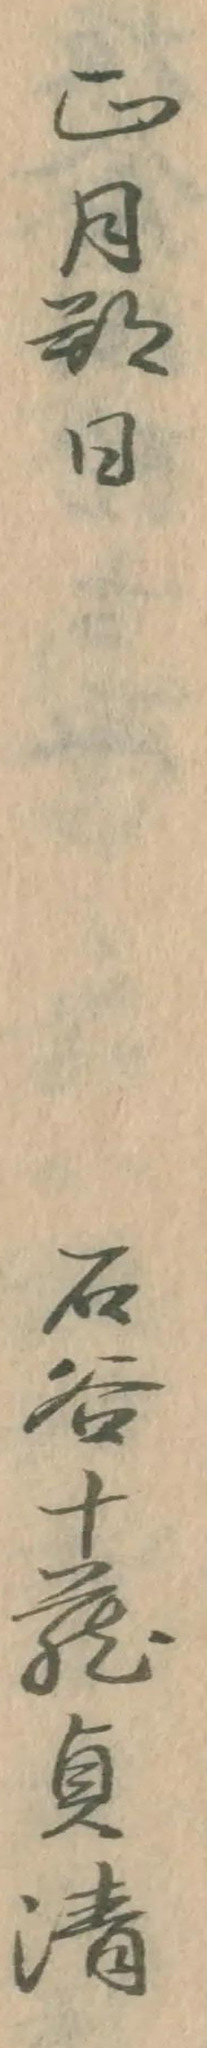正月朔日石谷十蔵貞清

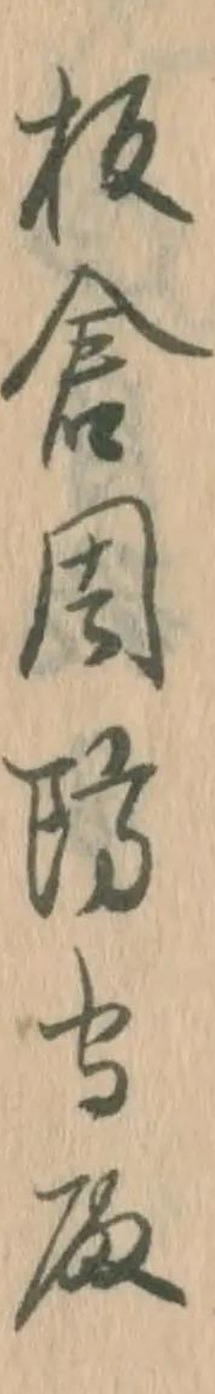板倉周防守殿
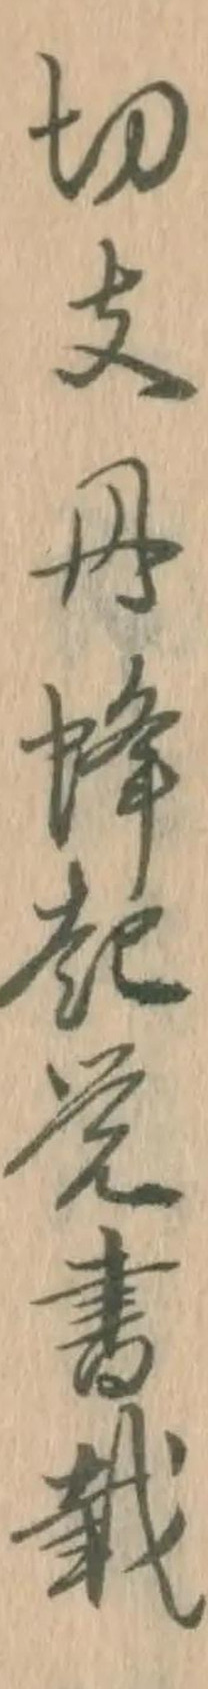切支丹蜂起覚書載
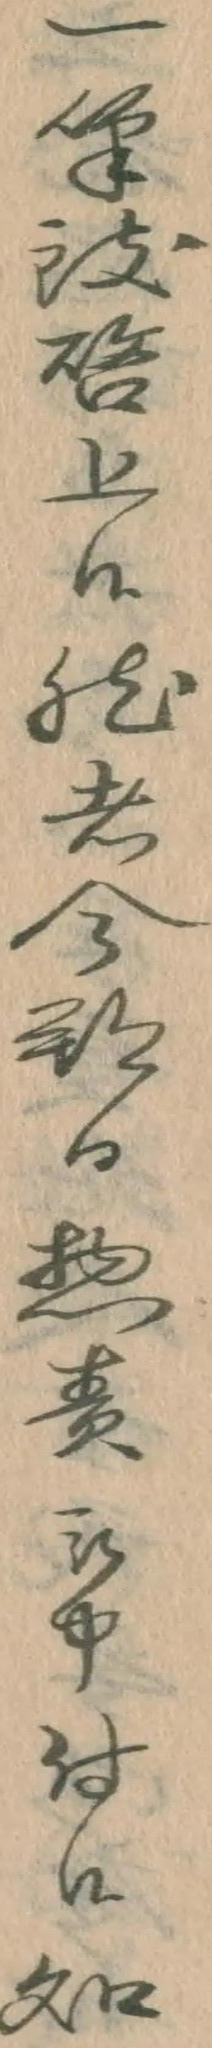一筆致啓上候然者今朔日惣責被申付候処
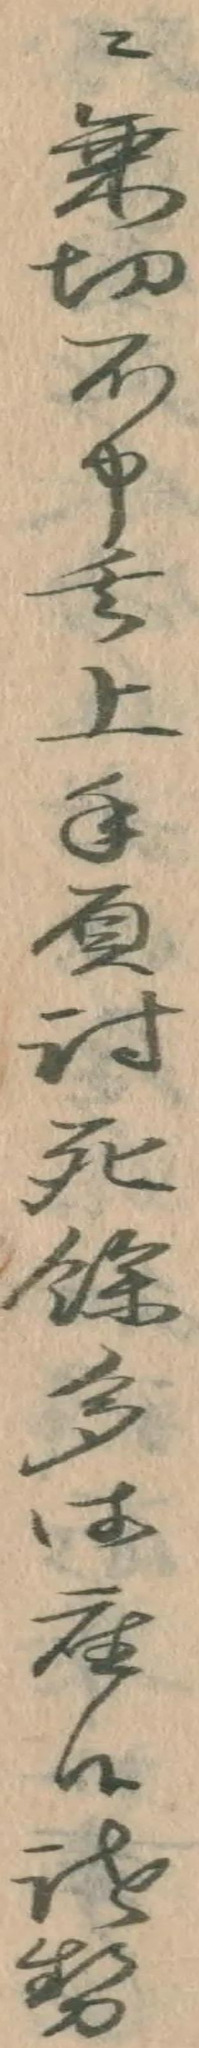に乗切不申其上手負討死余多御座候諸勢
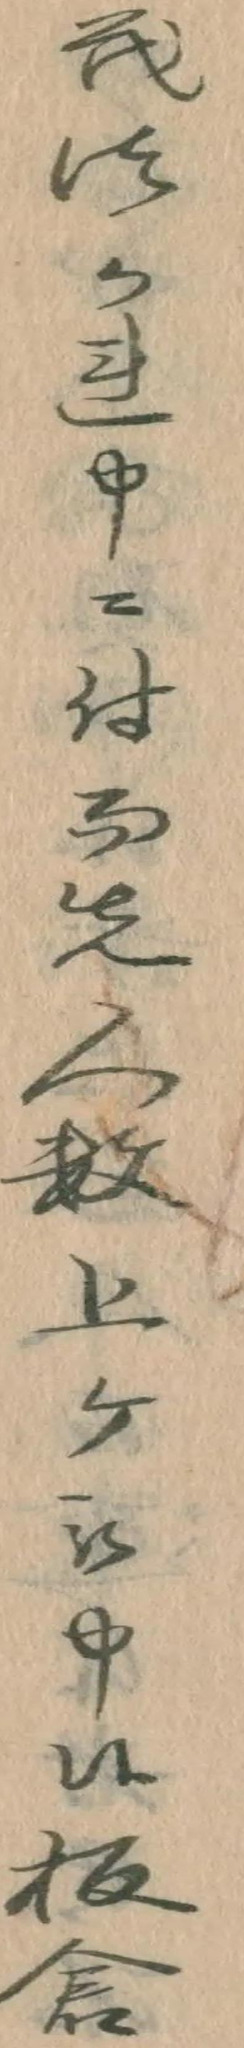茂徒か連申に付而先人数上け被申候板倉
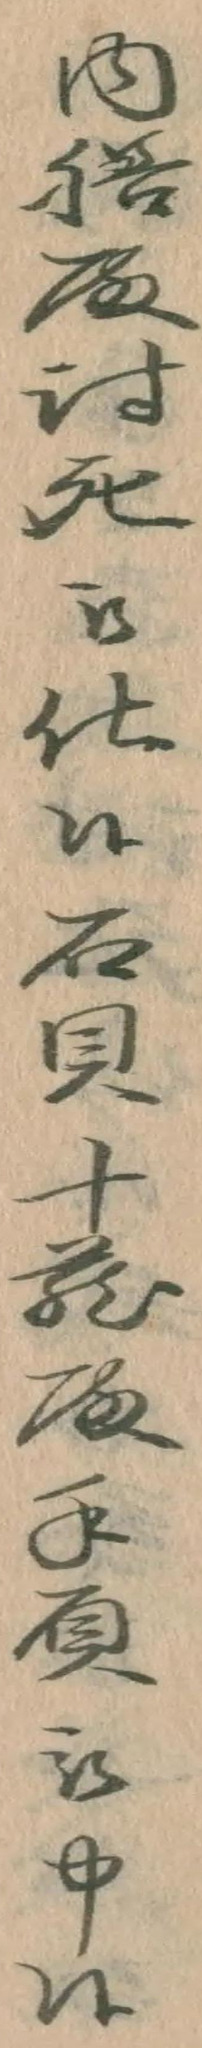内膳殿討死被仕候石貝十蔵殿手負被申候
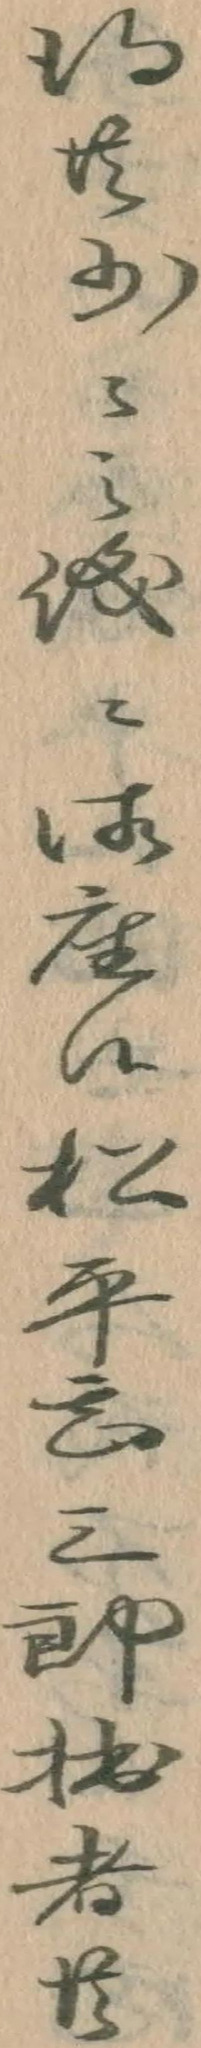得共少々之儀に御座候松平甚三郎拙者共
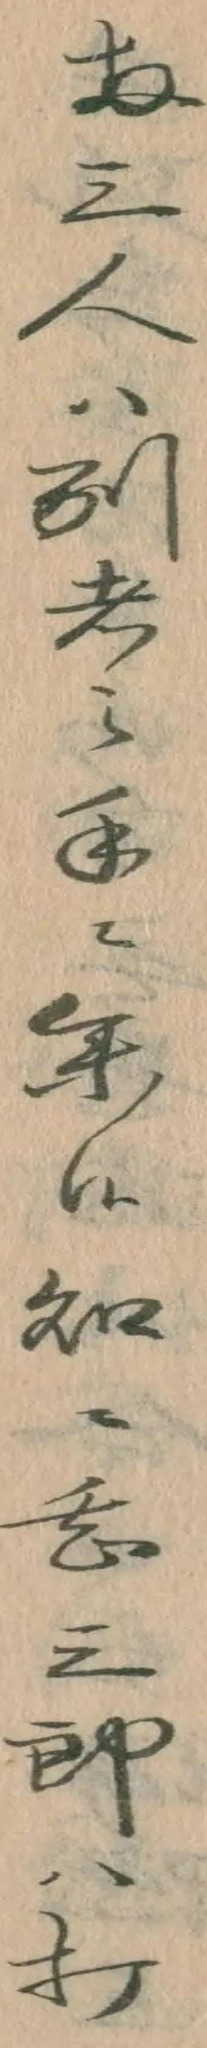両三人は別者之手に参候処に甚三郎は打
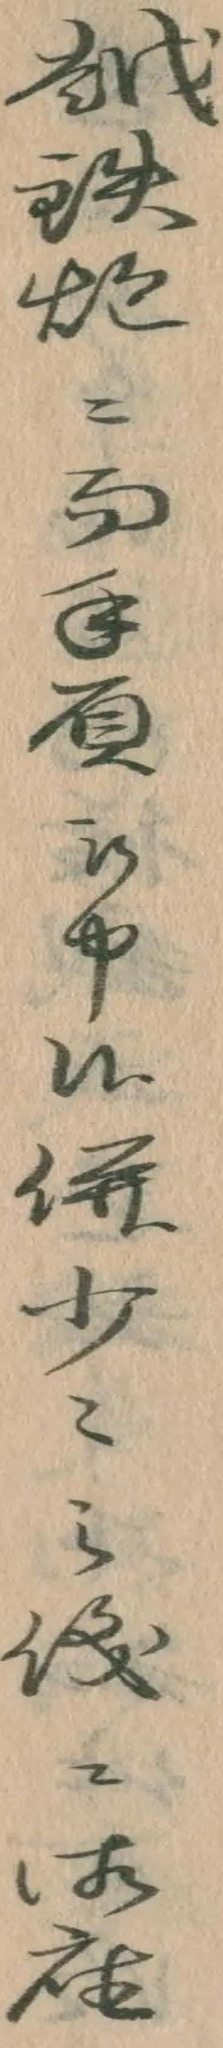越鉄炮に而手負被申候併少々之儀に御座
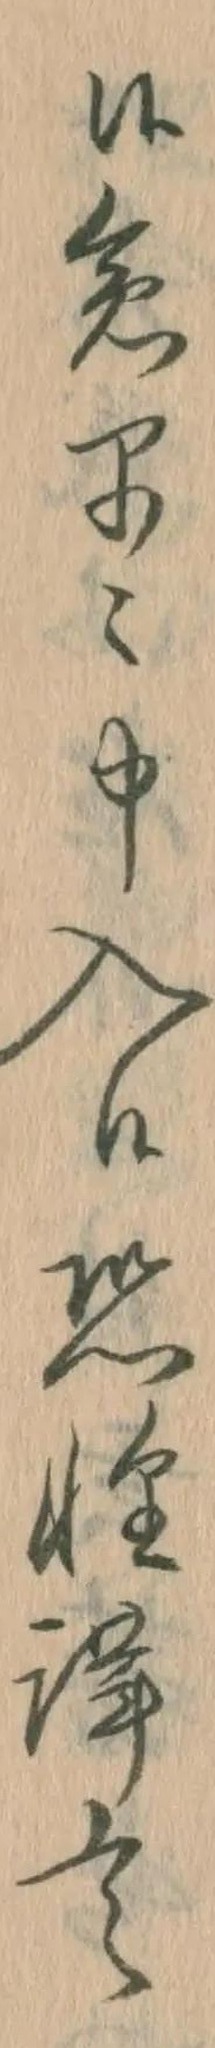候急早々申入恐惶謹言
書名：切支丹御退治記 49巻. [5]
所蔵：国立国会図書館 National Diet Library, JAPAN
